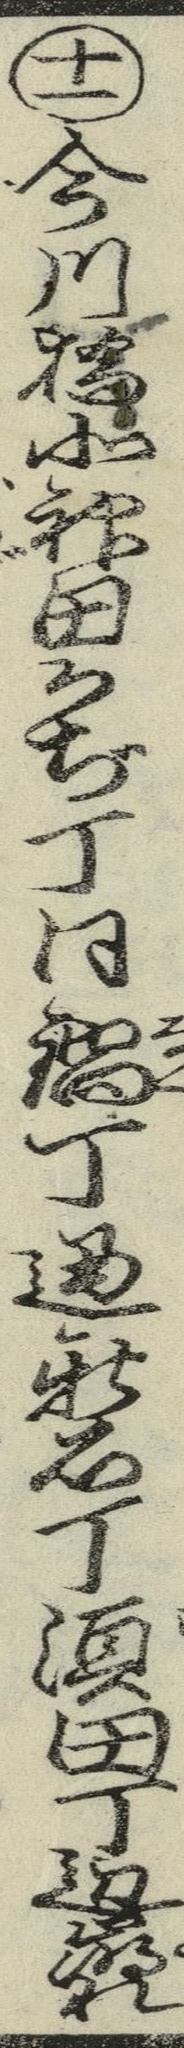十一今川橋北神田かぢ丁同鍋丁通新石丁須田丁辺崩れ
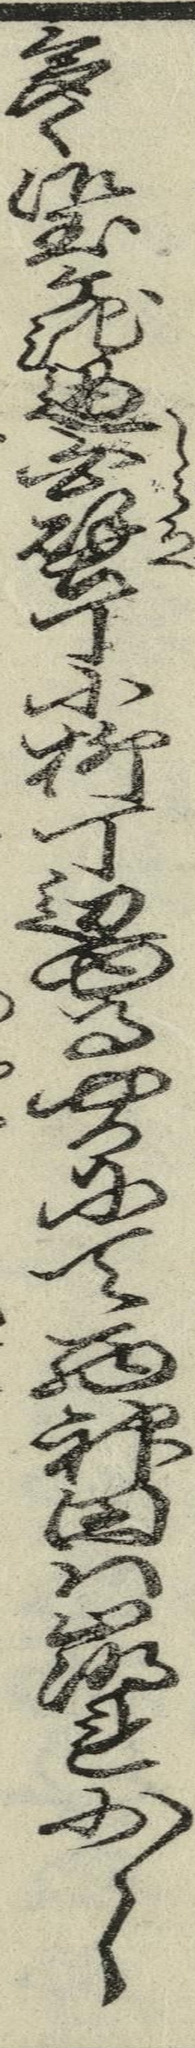多く御玉ヶ池通白壁丁小柳丁辺ゆるやかにて西神田は崩れ少し
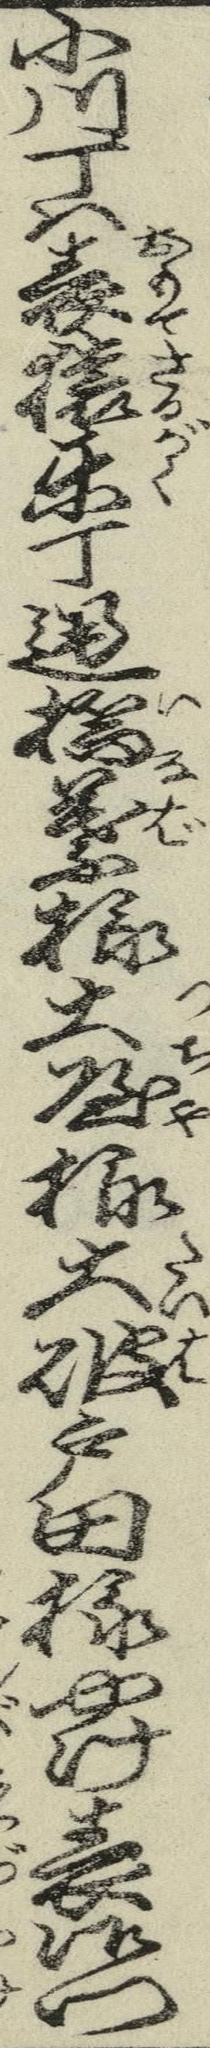小川丁は表猿楽丁遍稲葉様土屋様大破戸田様やけ表御門
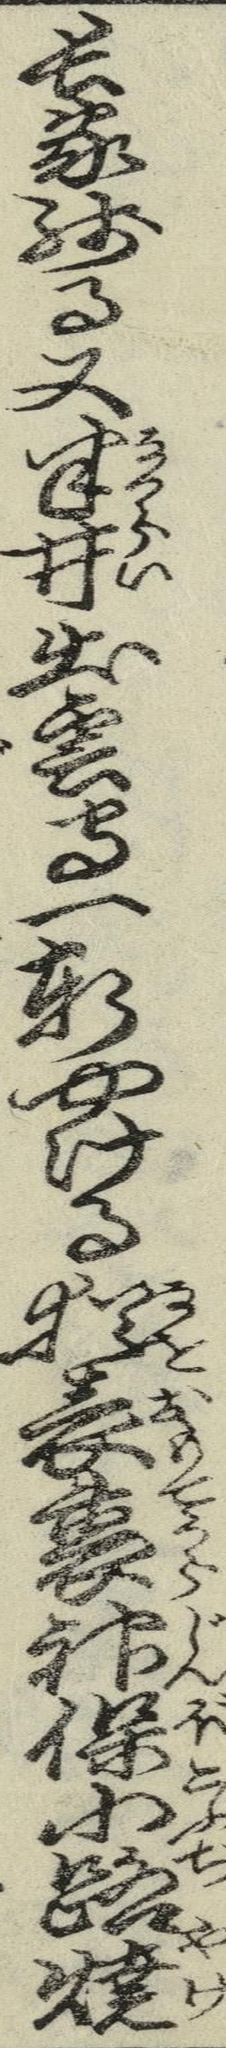長家残る又半井出雲守一軒やける猶表裏神保小路焼
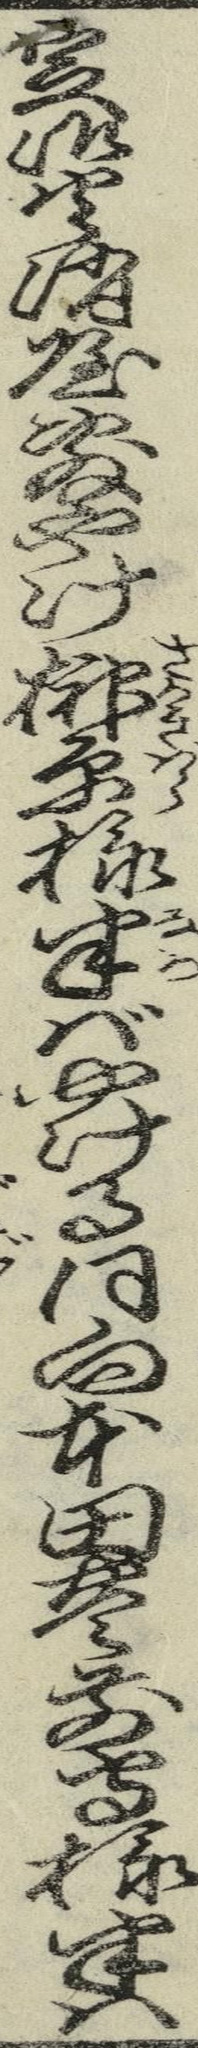定御火消屋敷やけ榊原様半ばやける同向本田豊前守様半は
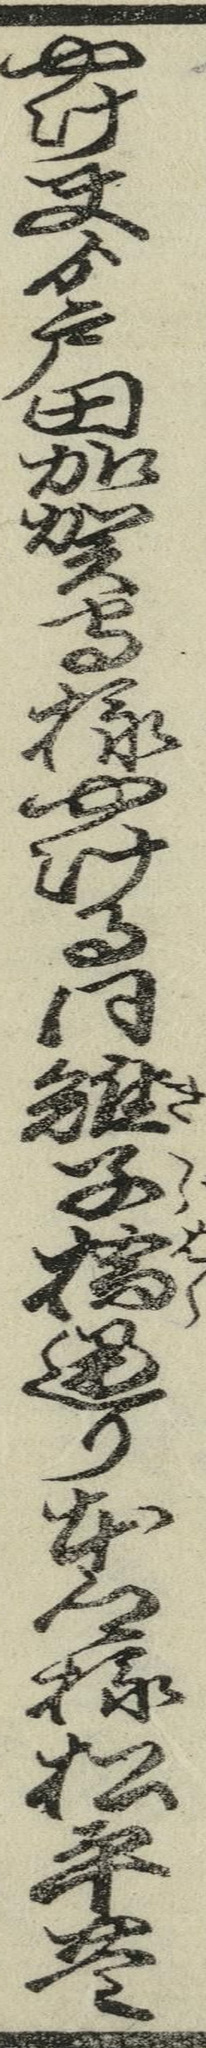やけ夫ゟ戸田加賀守様やける同雉子橋通り本郷様松平豊
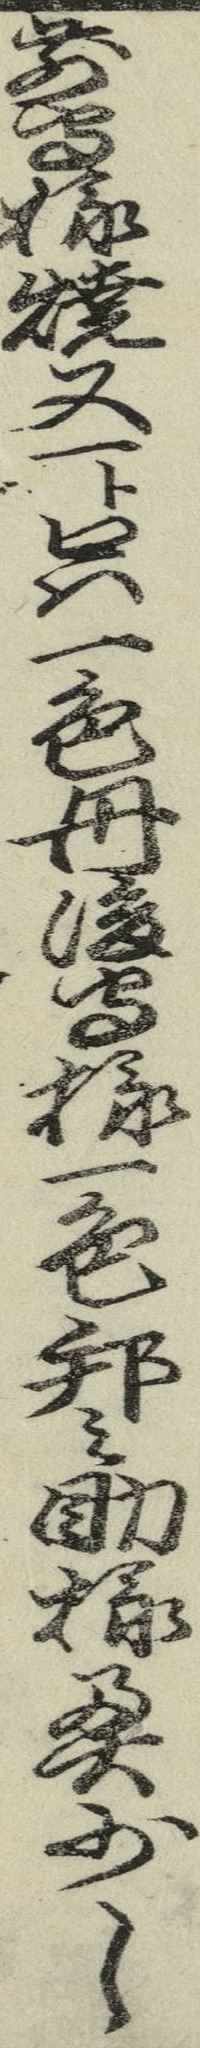前守様焼又一ト口は一色丹後守様一色邦之助様奥少し
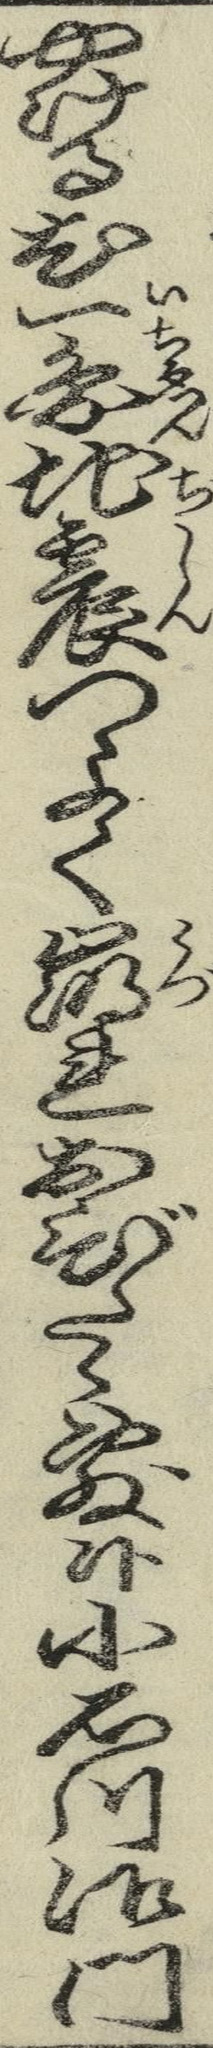やける尤一円地震つよく崩れおびたゝ敷候小石川御門

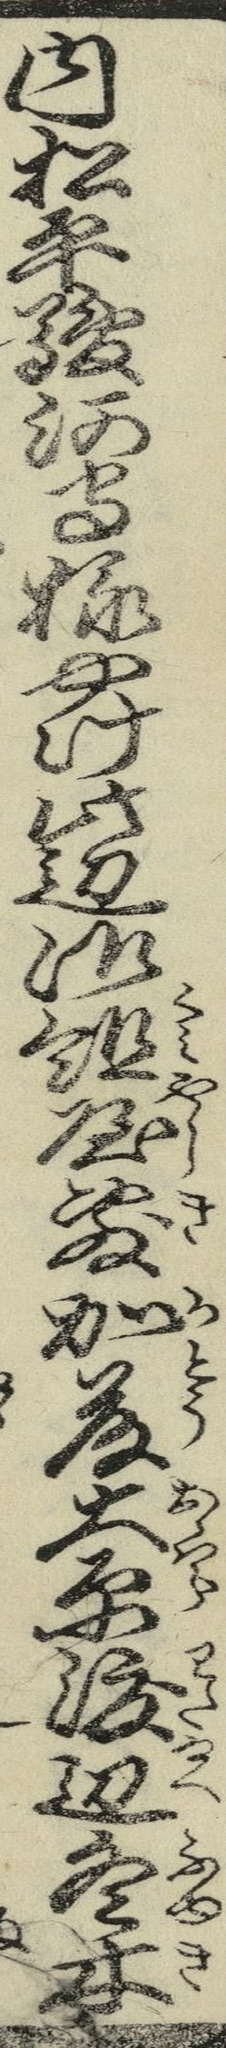内松平駿河守様やけ此辺御組屋敷加藤大原渡辺冬木
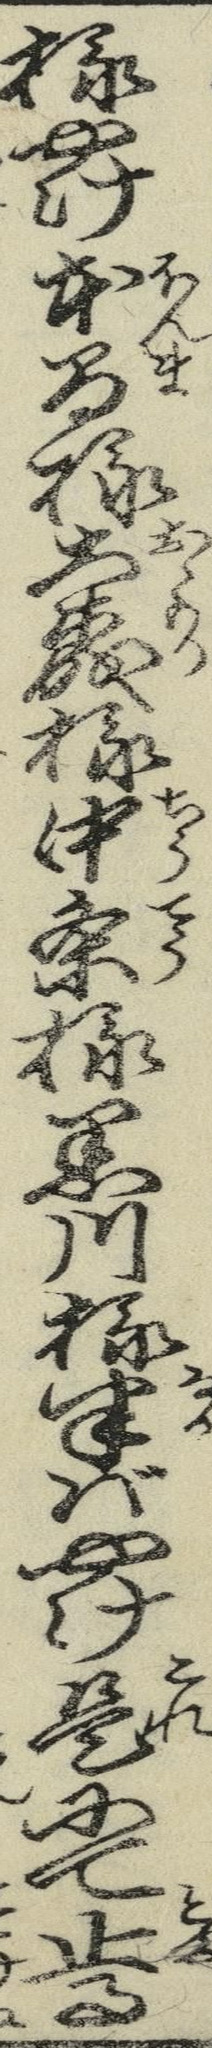様やけ本間様大森様中条様黒川様半ばやけ是にて止る
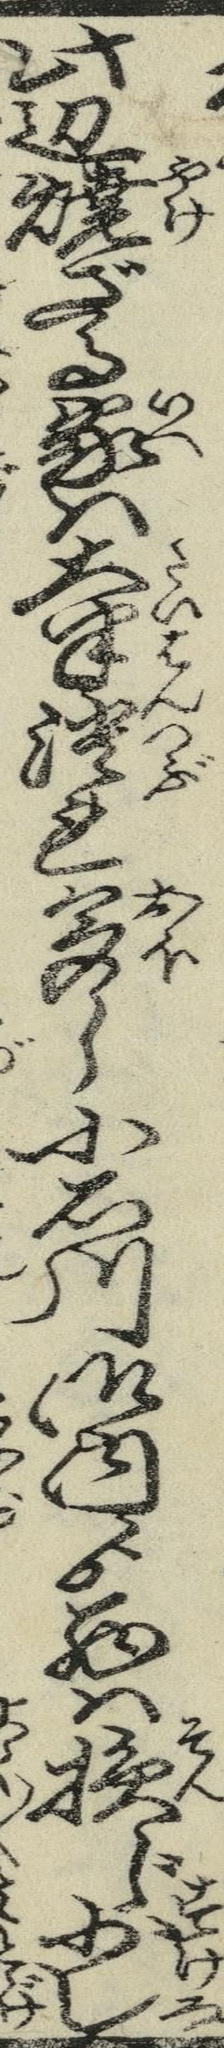此辺焼ざる家は大半潰れ多し小石川御門ゟ西は損じ少し
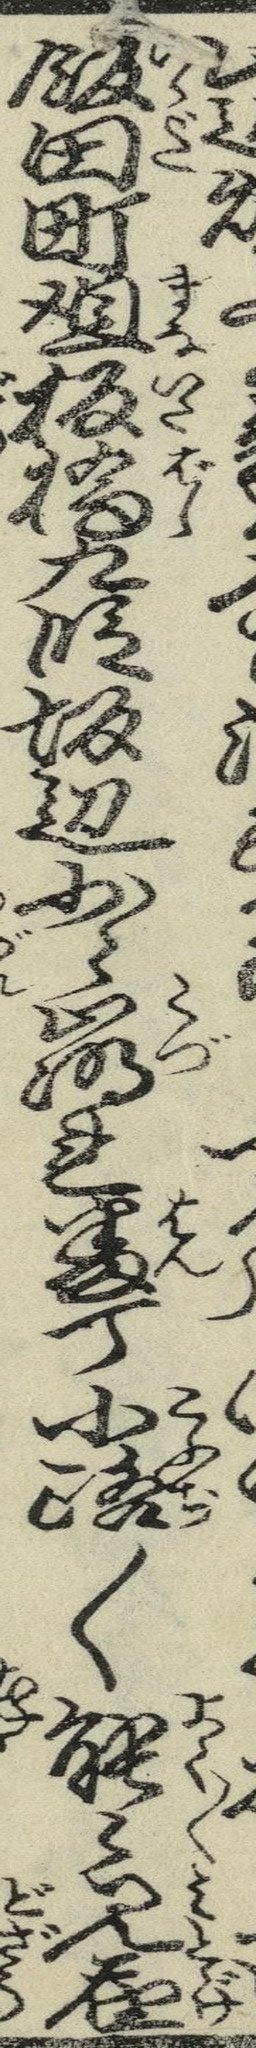飯田町俎板橋九段坂辺少々崩れ番丁小路〳〵能々見届
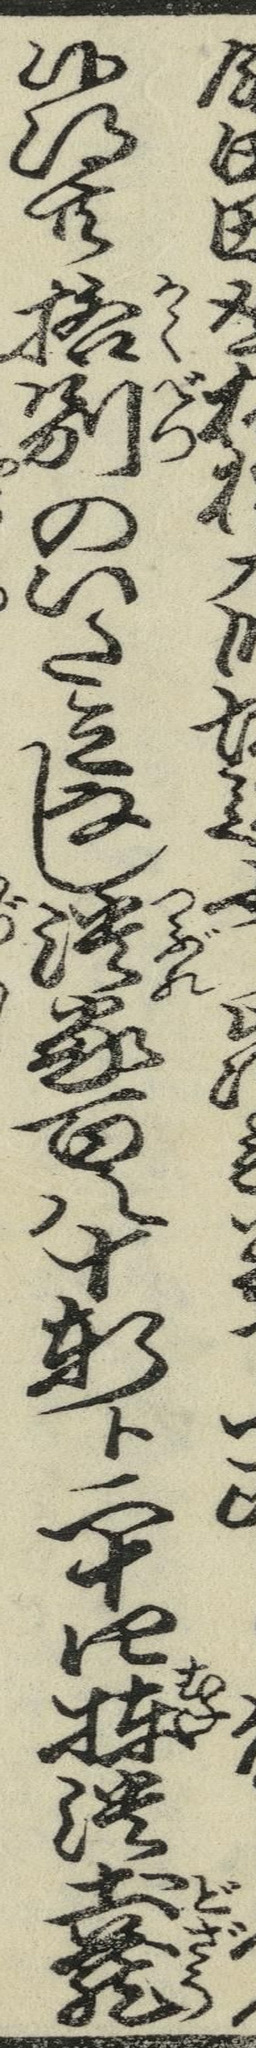候得共格別のいたみなし潰家百八十軒ト二十四棟潰土蔵
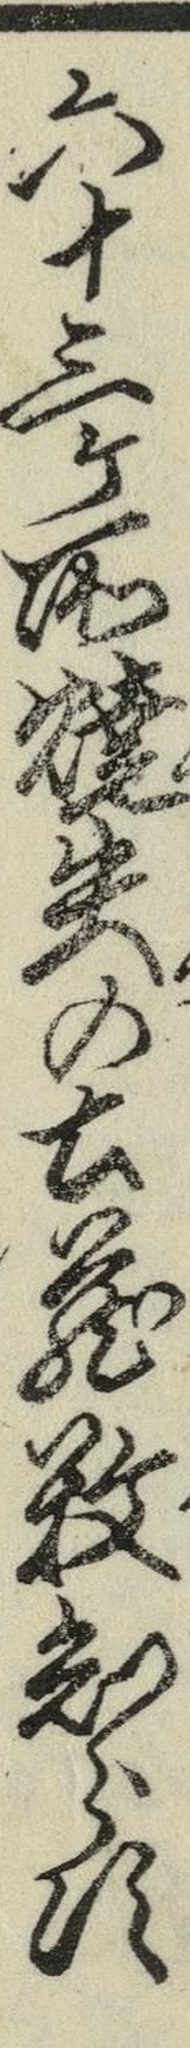六十三ケ所焼失の土蔵数知らす
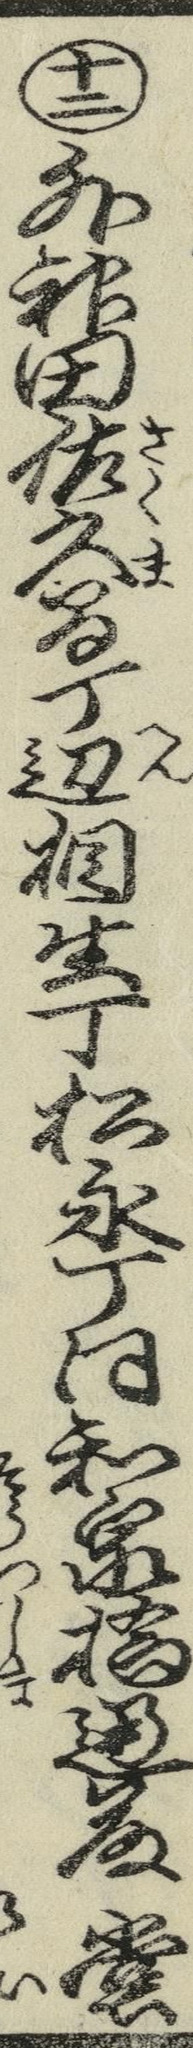十二外神田佐久間丁辺相生丁松永丁同和泉橋通藤堂
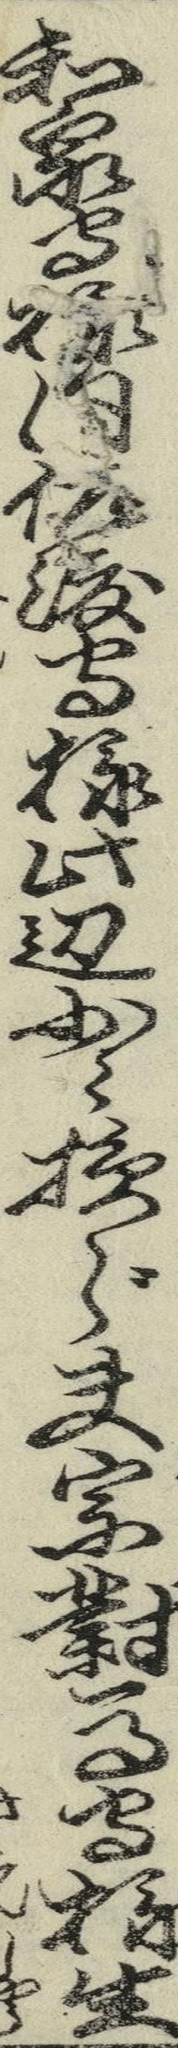和泉守様同佐渡守様此辺少々損じ夫宗対馬守様生
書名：地震年代記
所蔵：東京大学地震研究所図書室 Earthquake Research Institute Library, The University of Tokyo, JAPAN
